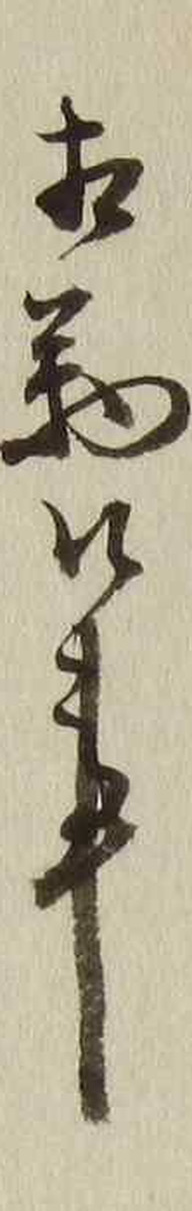相勤候事
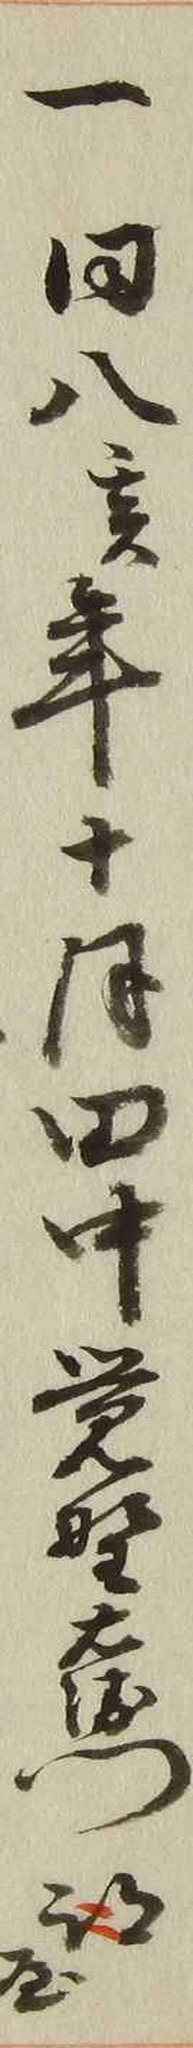一同八亥年十月田中覚野右衛門跡屋
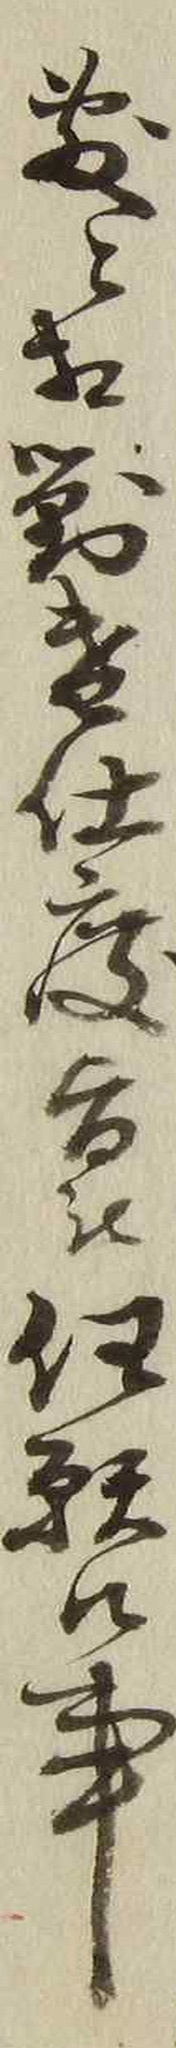敷と相對替仕度旨被任願候事
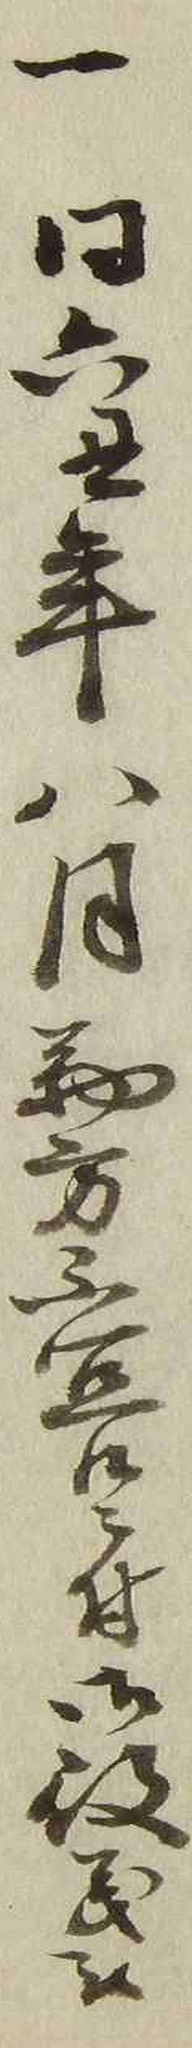一同六丑年八月勤方不宜候ニ付御役義被
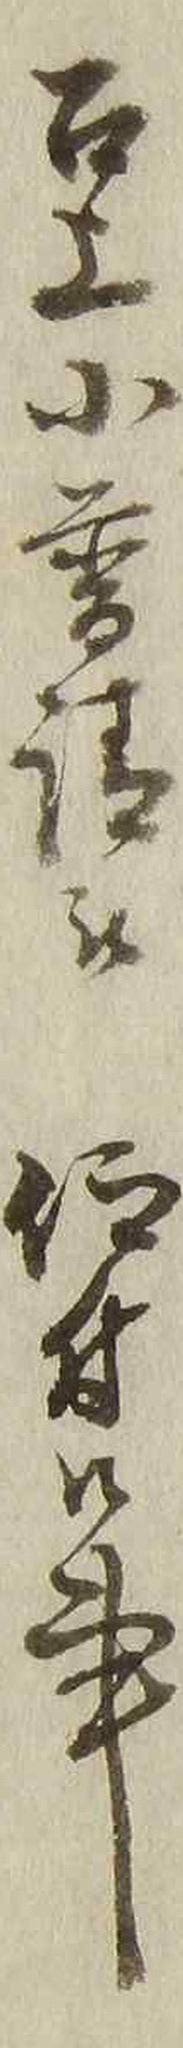召上小普請被仰付候事
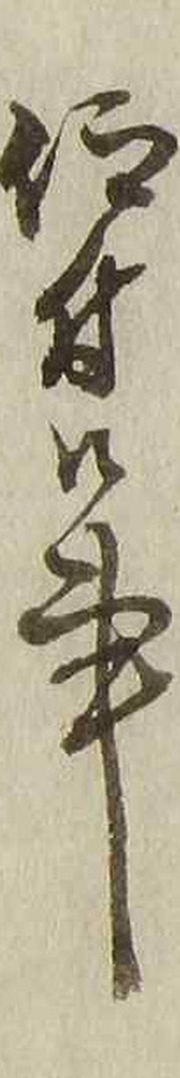仰付候事

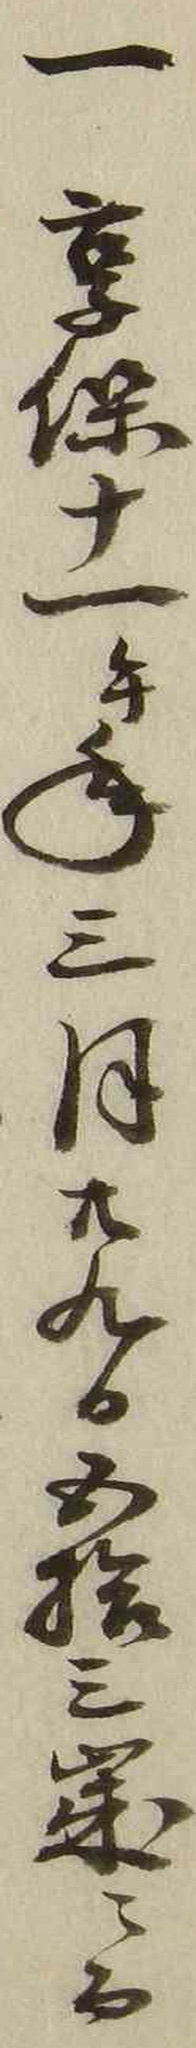一享保十一午三月廿九日五拾三歳ニ而
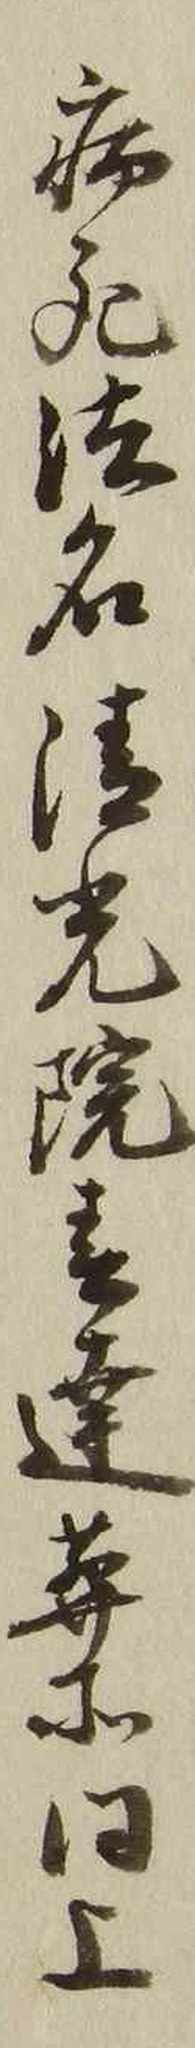病死法名清光院春達葬所堂上
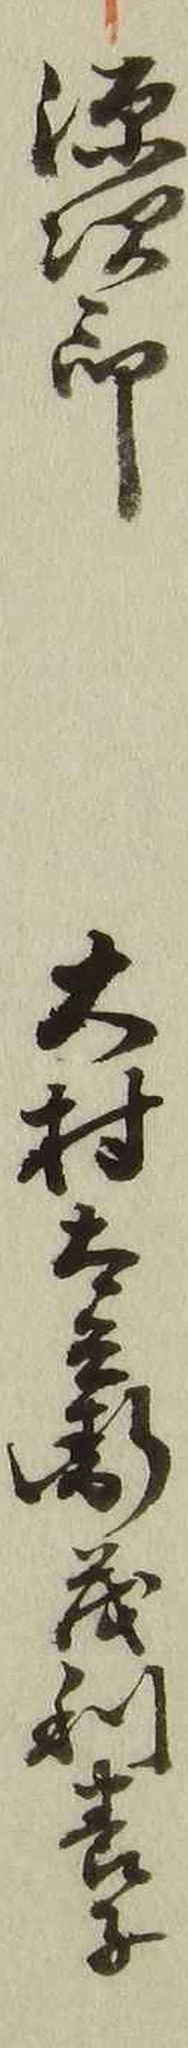源次郎大村太兵衛茂利養子
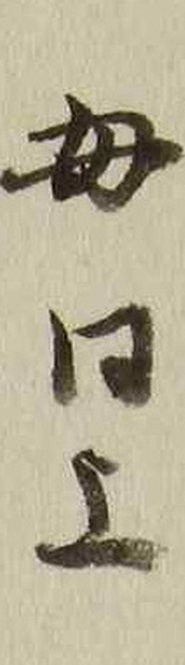母同上
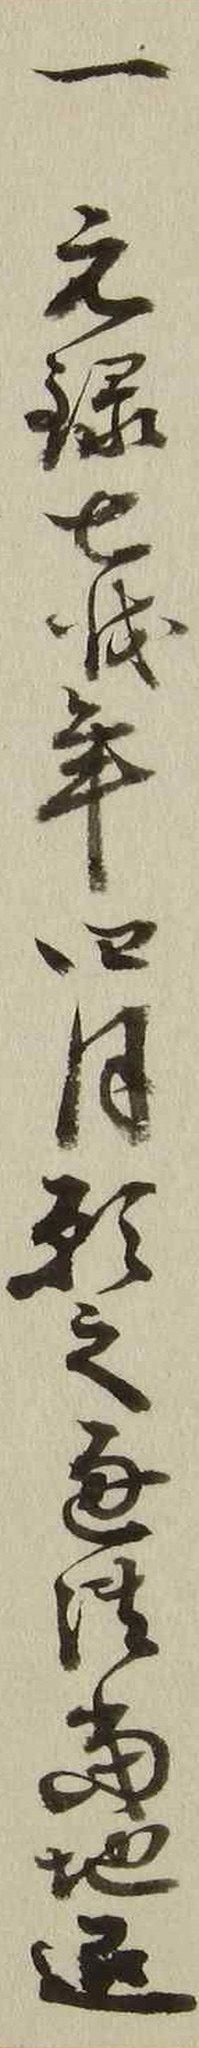一元禄七戌年四月願之通御当地退
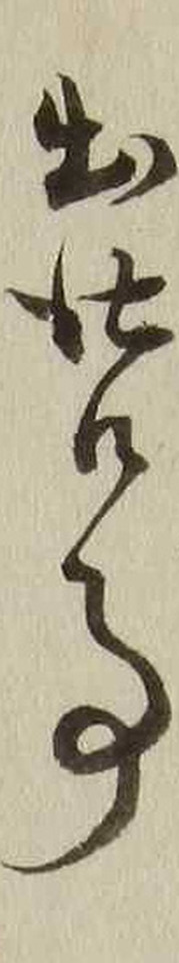出仕候事
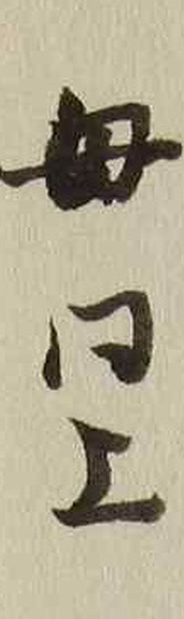母同上
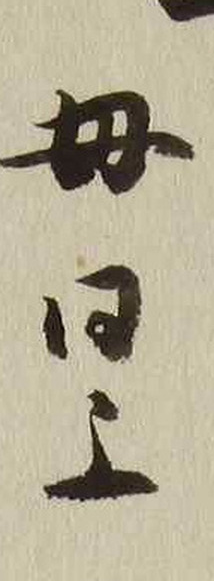母同上
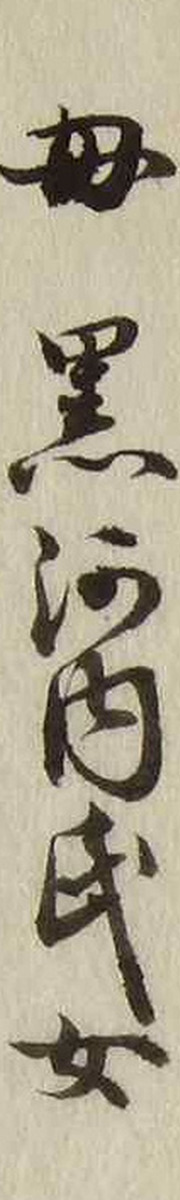母黒河内氏女
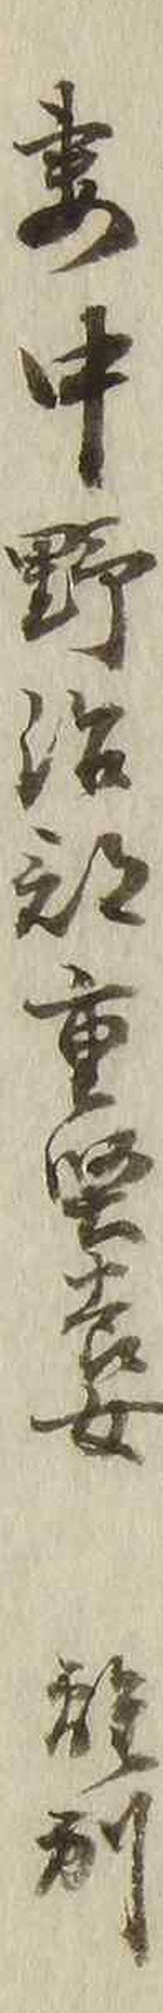妻中野治部重堅養女離別
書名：諸士系譜　巻之31　い之部31
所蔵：会津若松市立会津図書館
